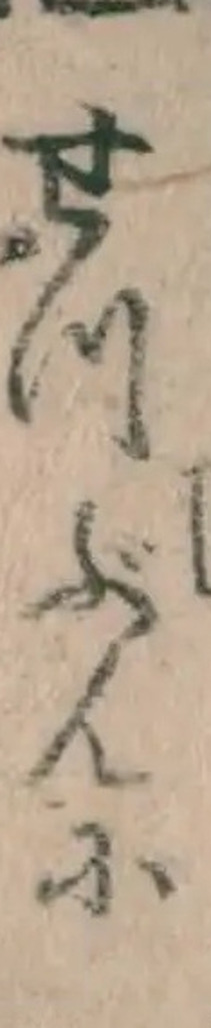せつぶんに
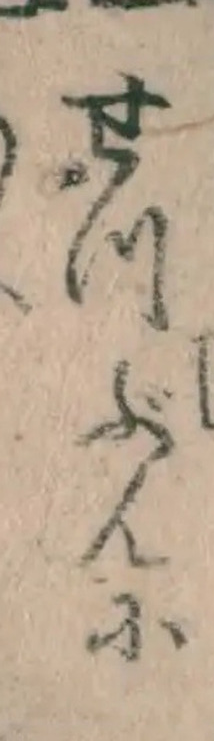せつぶんに
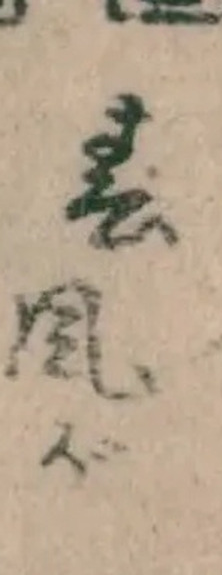春風が
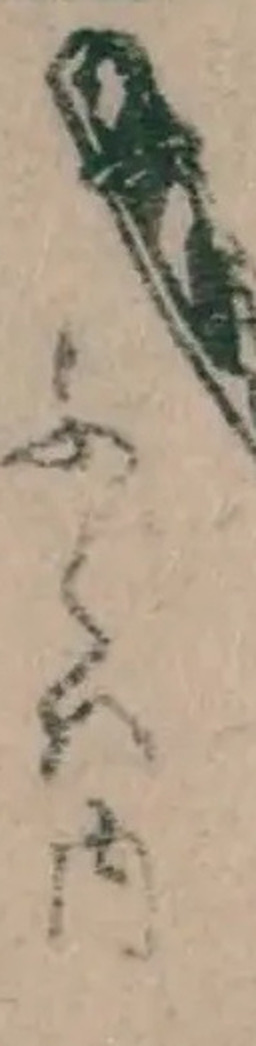ふくは内
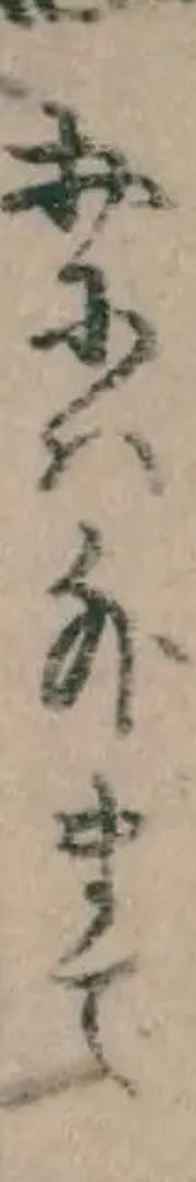おには外まて
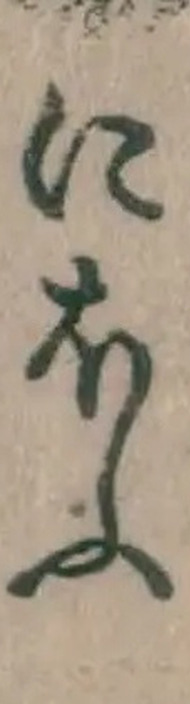ひほふ
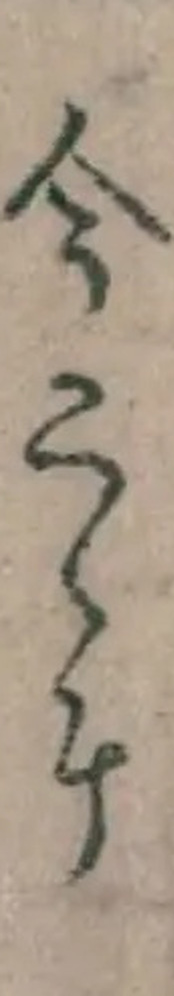今こゝに
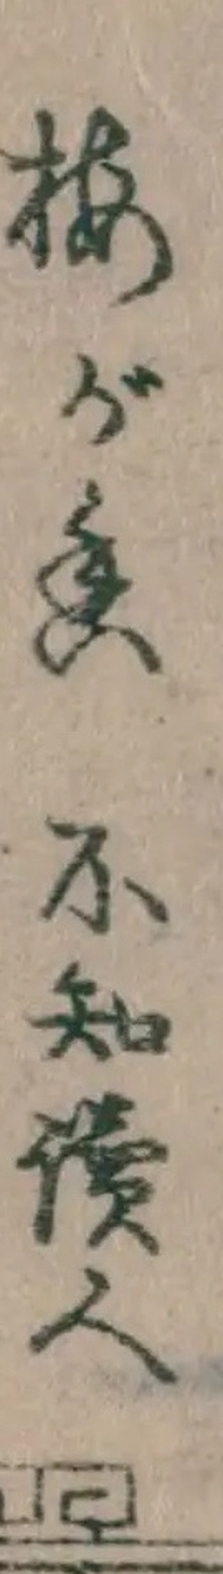梅が香不知読人
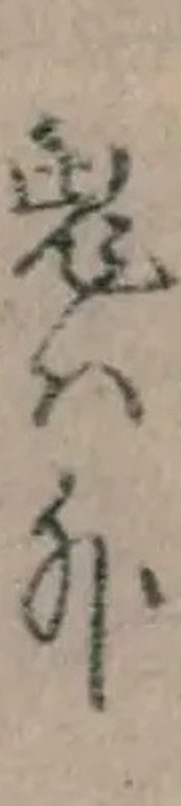鬼は外
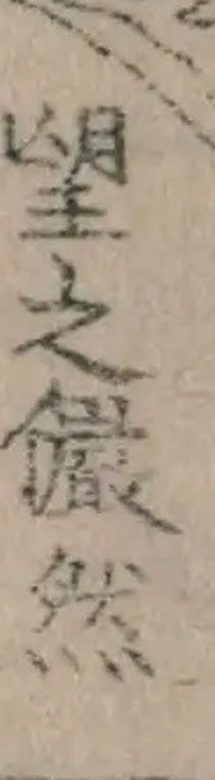望之儼然
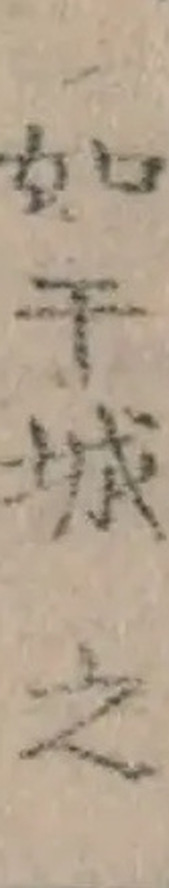如干城之
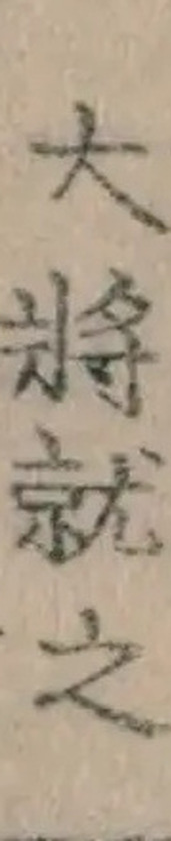大将就之
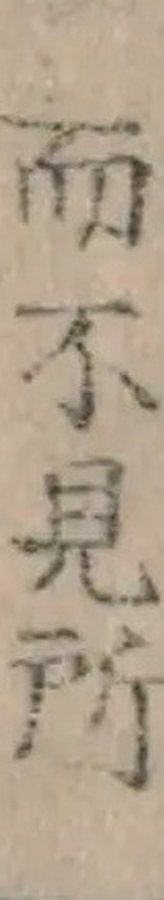而不見所
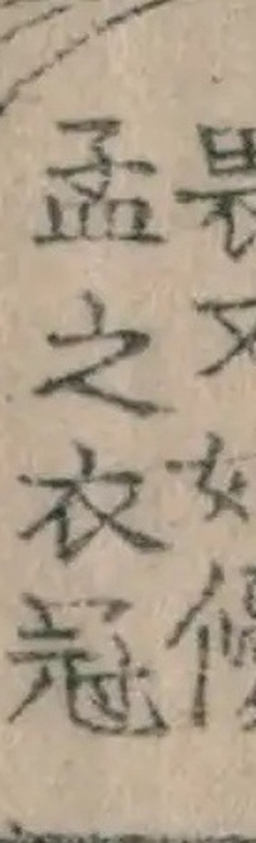孟之衣冠
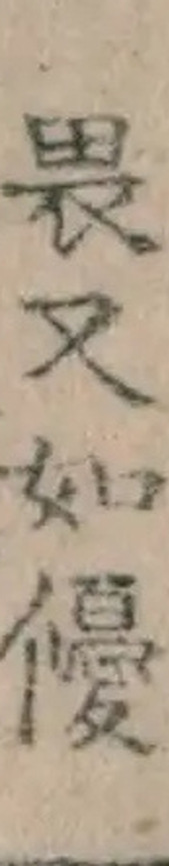畏又如優
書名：大時代唐土化物 3巻
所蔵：国立国会図書館 National Diet Library, JAPAN
